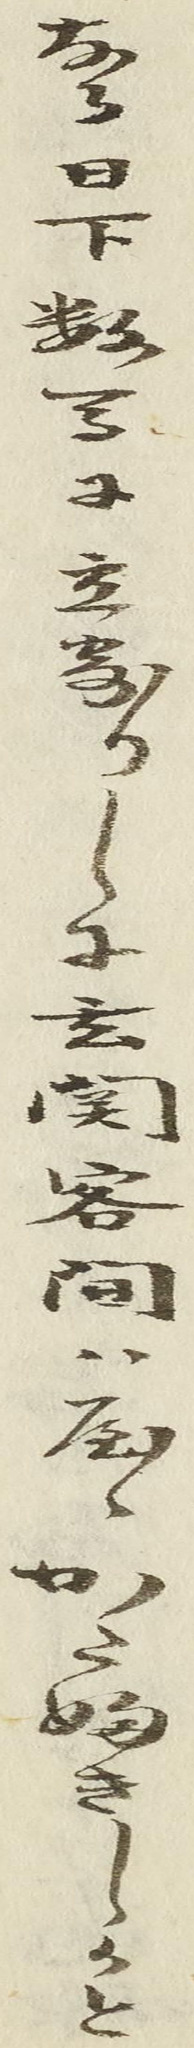なる日下数馬に立寄りしに玄関客間ハやゝかたふきしかと
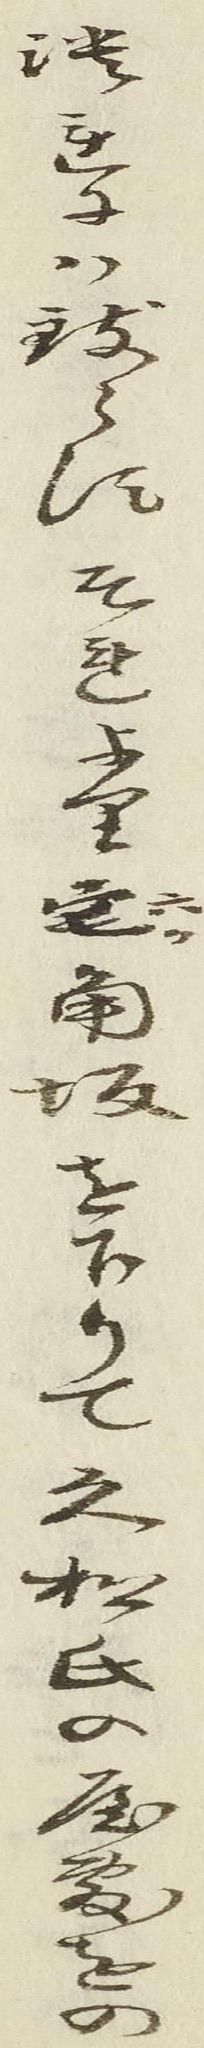潰れにハ到らすそれより宅甬坂を下りて久松氏の屋敷をの
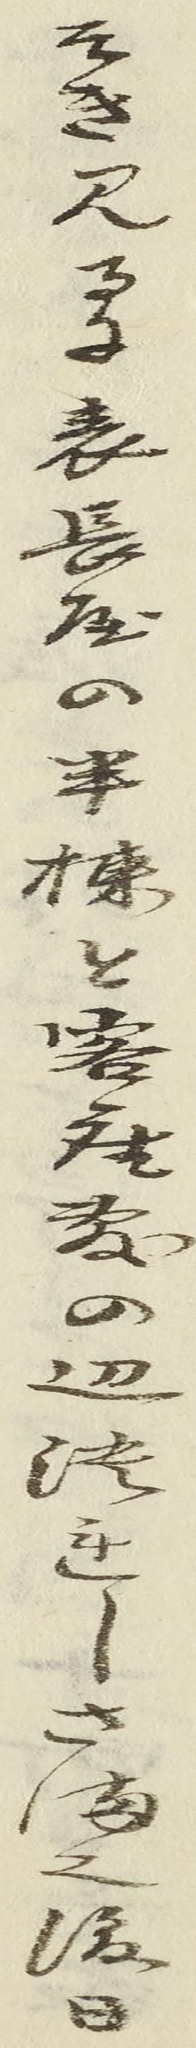そき見るに表長屋の半棟と客座敷の辺潰れしさま也後日
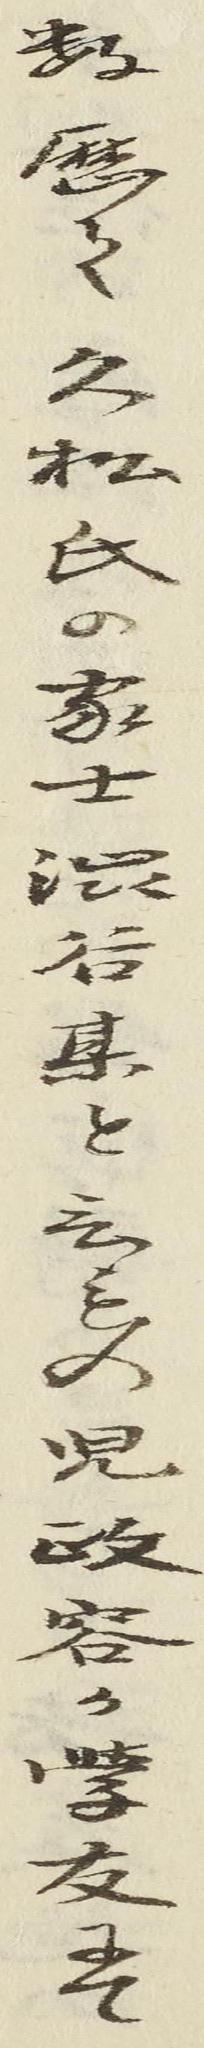数歴て久松氏の家士渋谷某と云もの児改容か学友にて
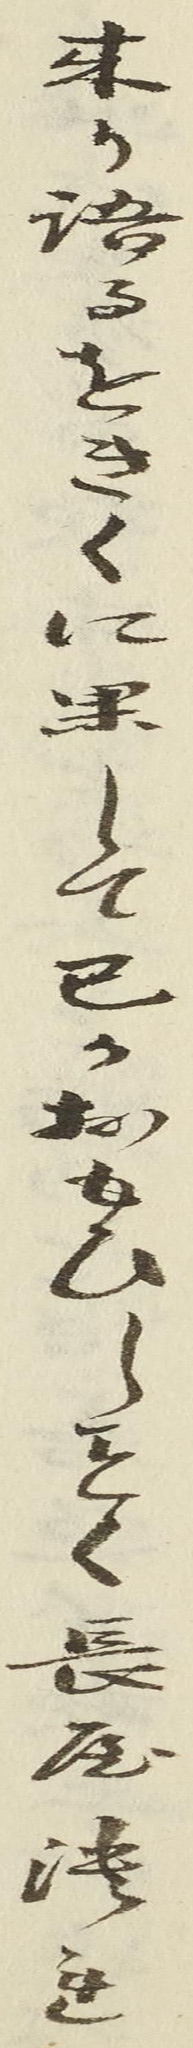来り語るをきくに果して己かおもひしことく長屋潰れ
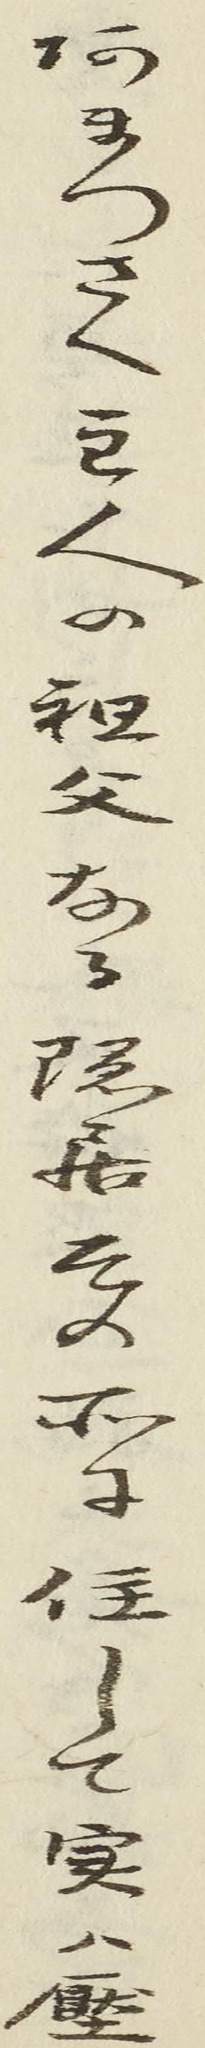あまつさへ主人の祖父なる隠居その所に住して実ハ圧
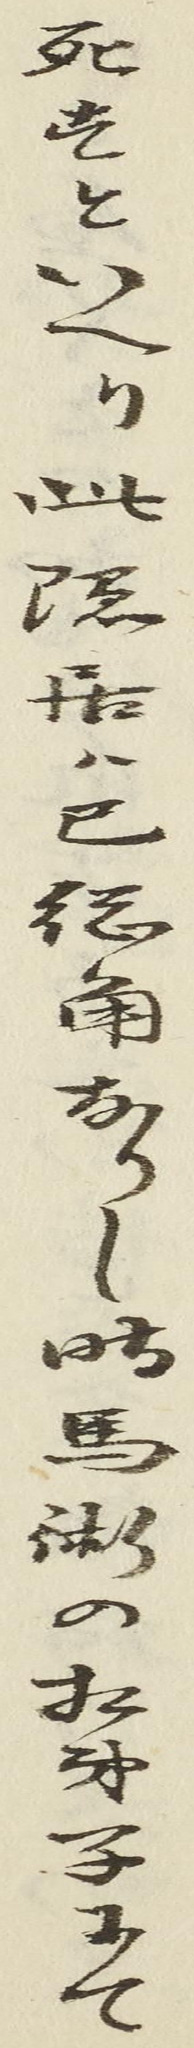死すといへり此隠居は己征甬なりし時馬術の相弟子にて
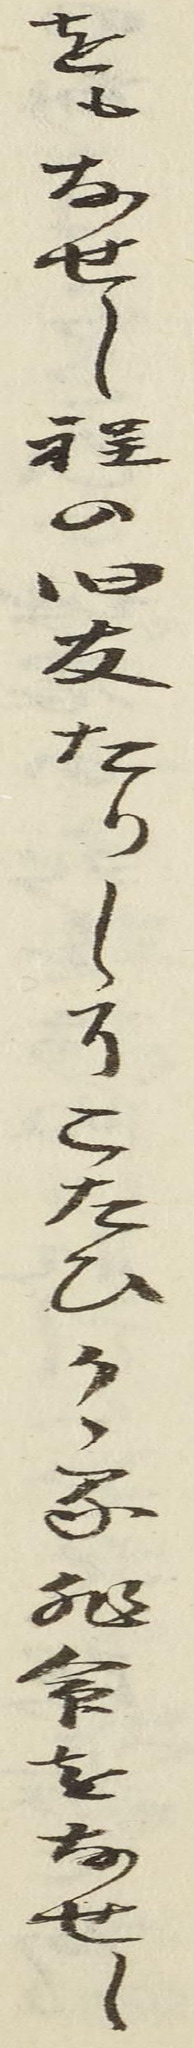をもなせし程の旧友たりしにこたひかゝる飛命をなせし
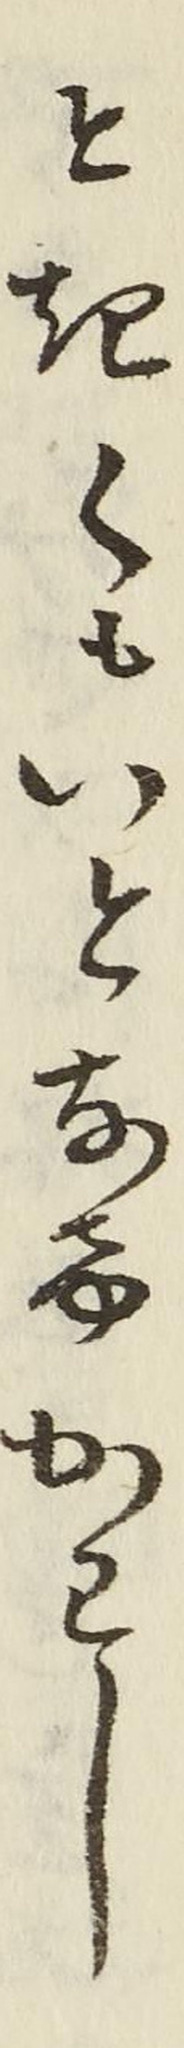ときくもいとなけかわし

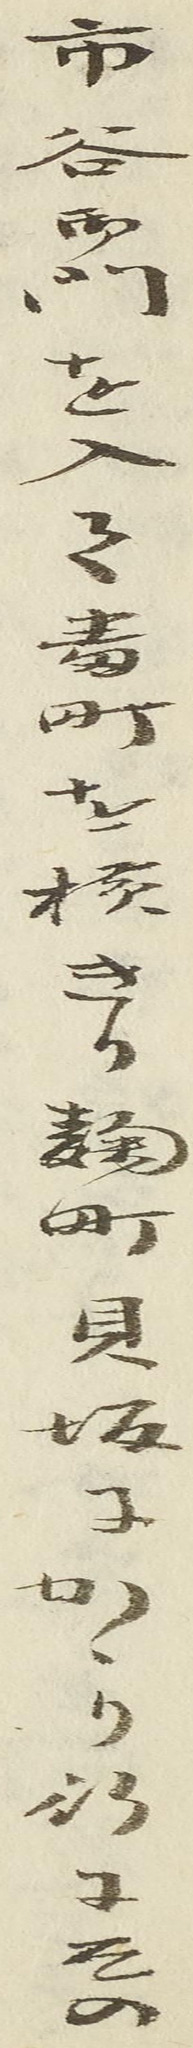市谷御門入て番町を横きり麹町見坂にかゝり行にその
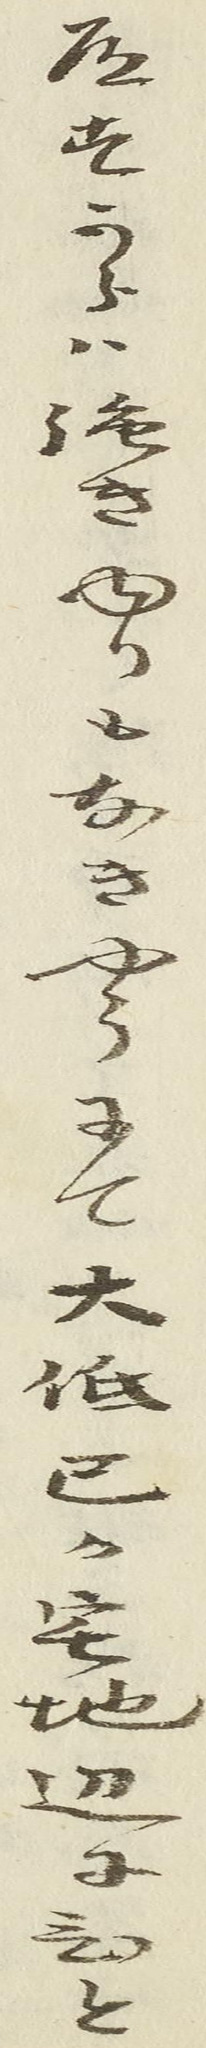道すからハ強きゆりもなきやうにて大低己か宅地辺にひと
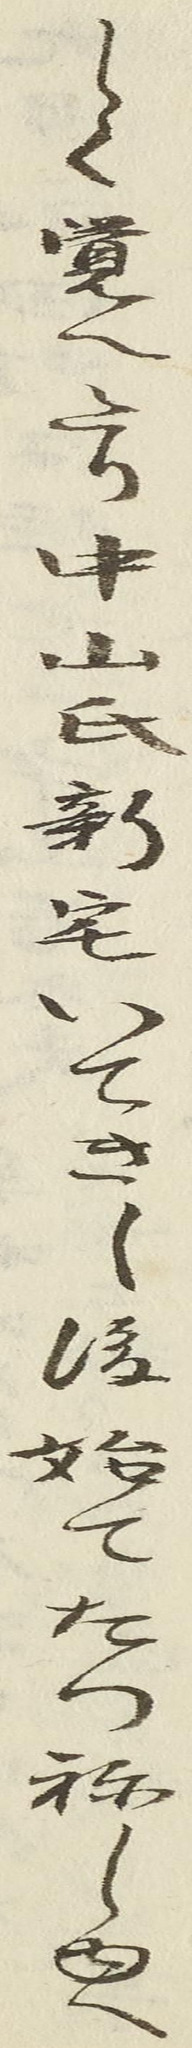しく覚へたり中山氏新宅いてきし後始てたつねしゆへ
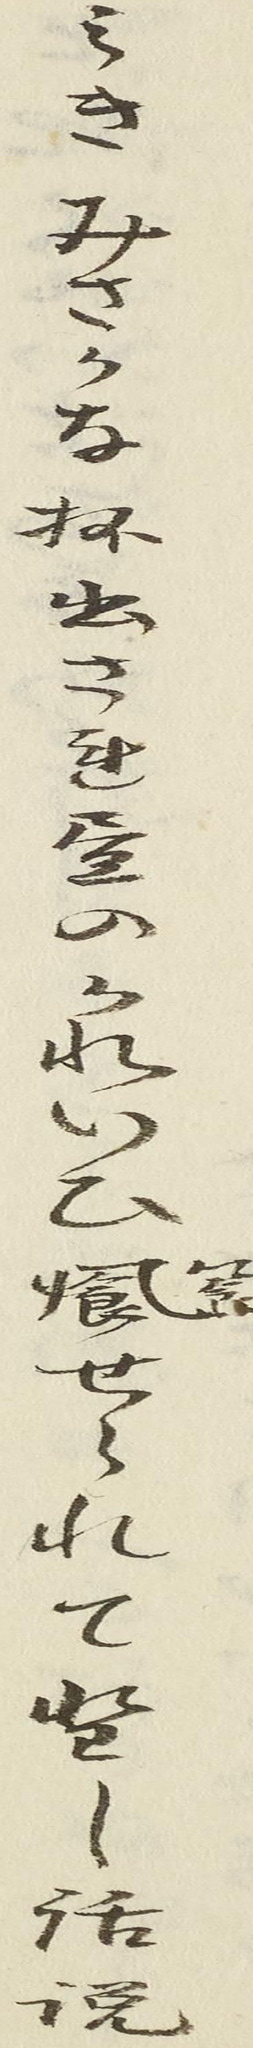ミきみさかな抔出され昼のかれいひ饗せられて暫し話説
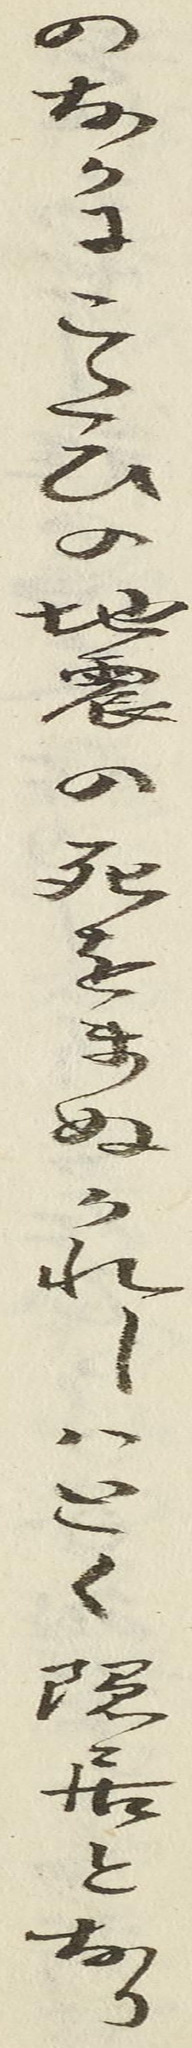のなかにこたひの地震の死をまぬかれしハとく隠居となり
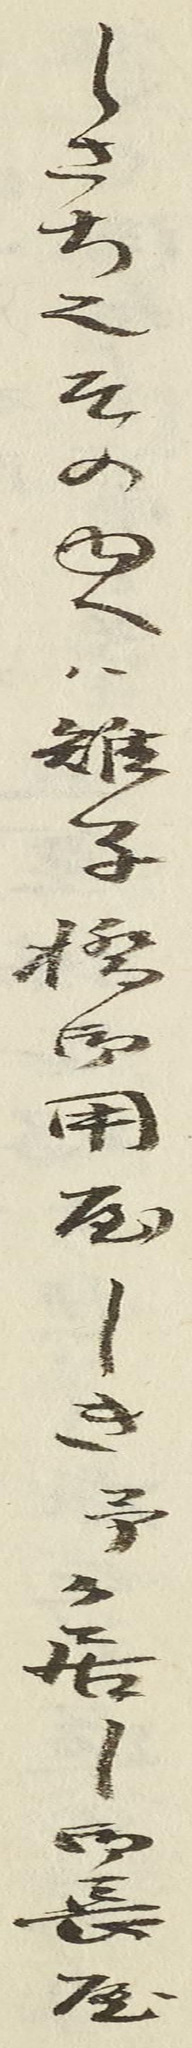しさち也そのゆへハ雉子橋御用屋しき予か居し御長屋
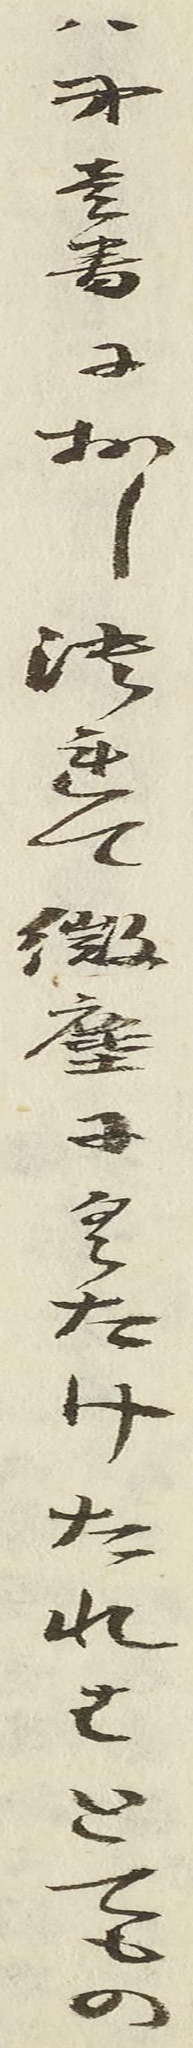ハ第一番におし潰れて微塵にくたけたれはとてもの
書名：那為の後見艸　全
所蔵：東京大学地震研究所図書室 Earthquake Research Institute Library, The University of Tokyo, JAPAN
